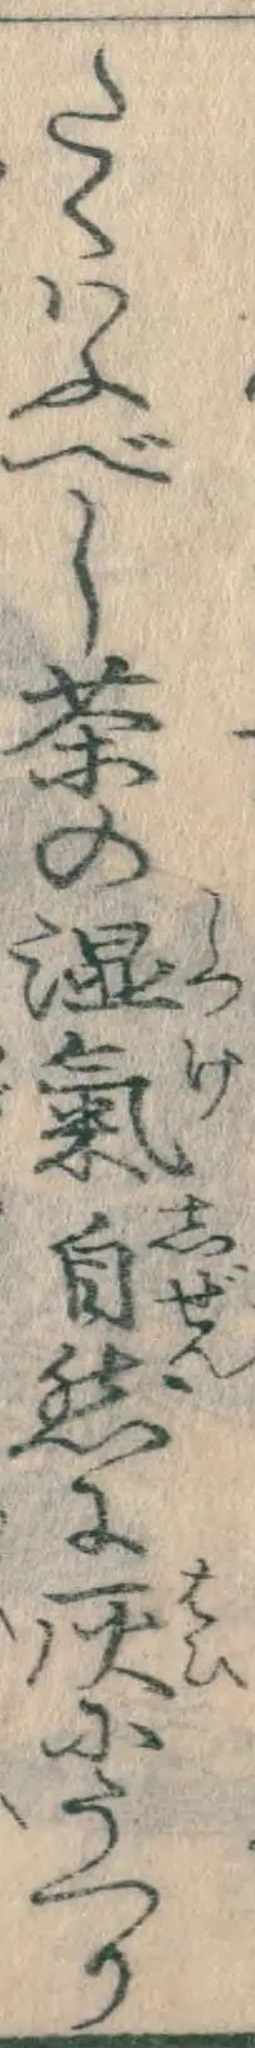たくはふべし茶の湿気自然に灰にうつり
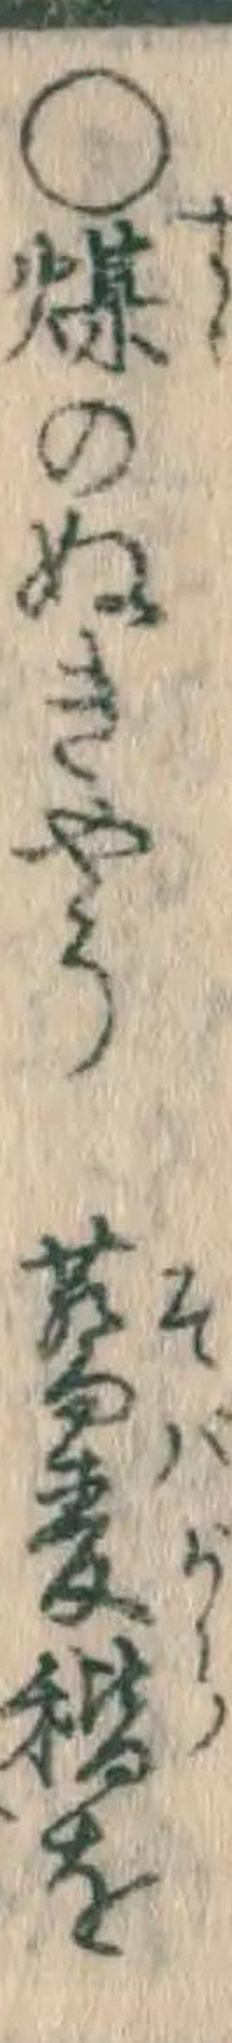○煤のぬきやう蕎麦稭を
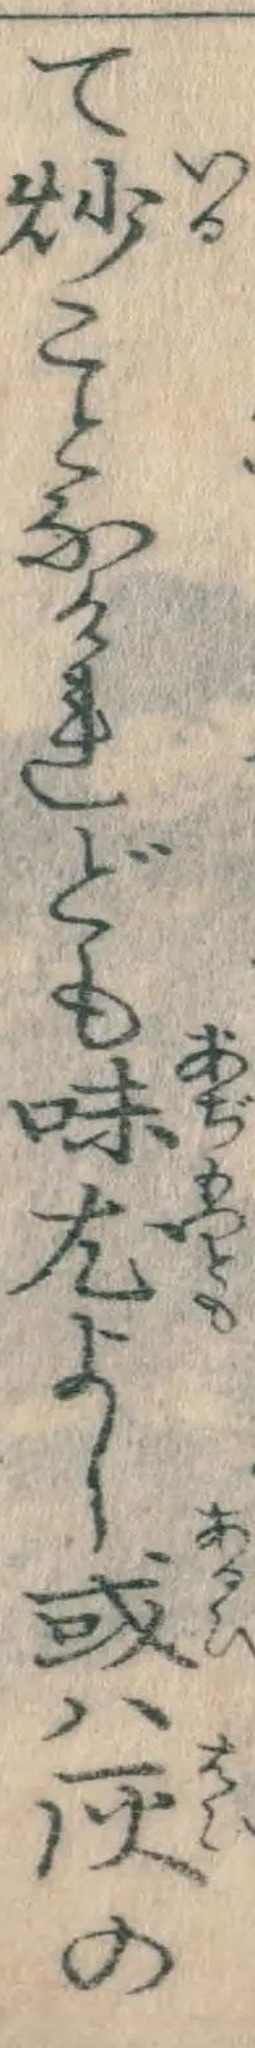て炒ことなけれども味尤よし或は灰の
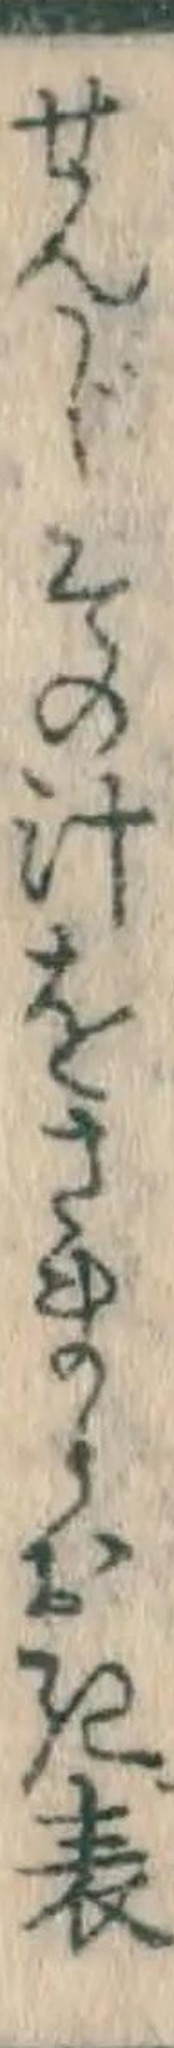せんじその汁をさましおき表
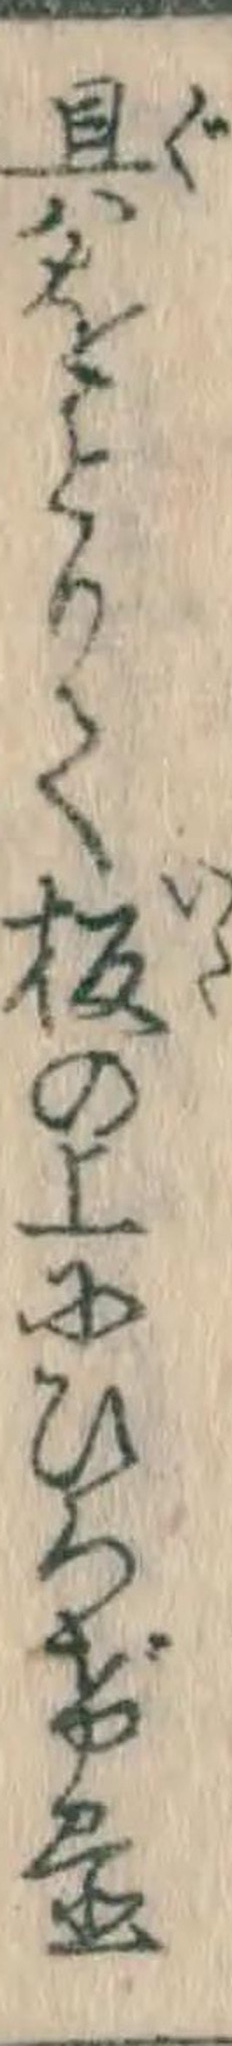具をとりて板の上にひろげ置
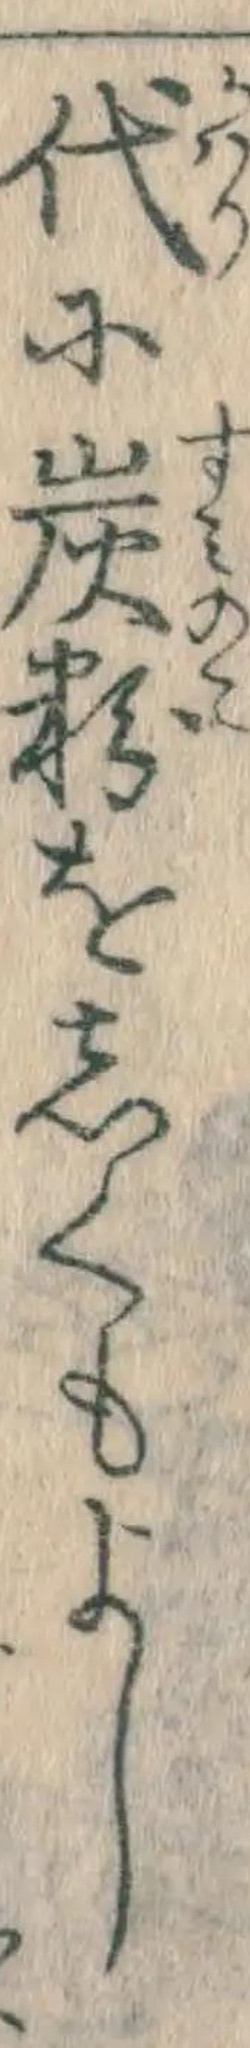代に炭粉をしくもよし
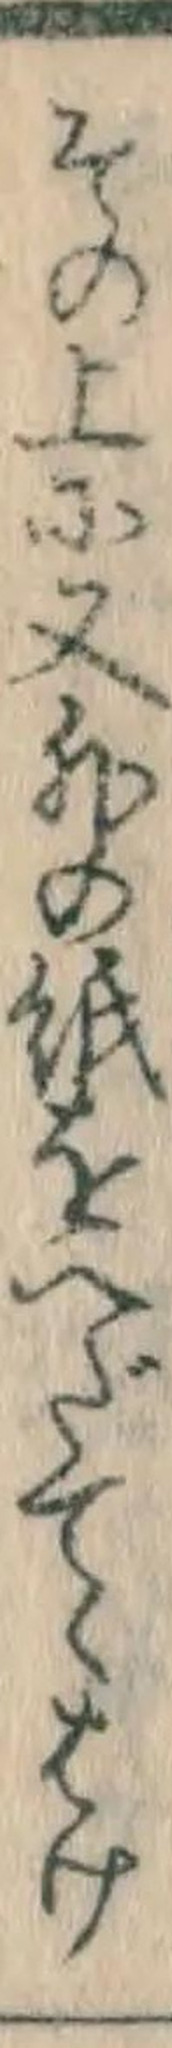その上に又外の紙をへだてゝはけ
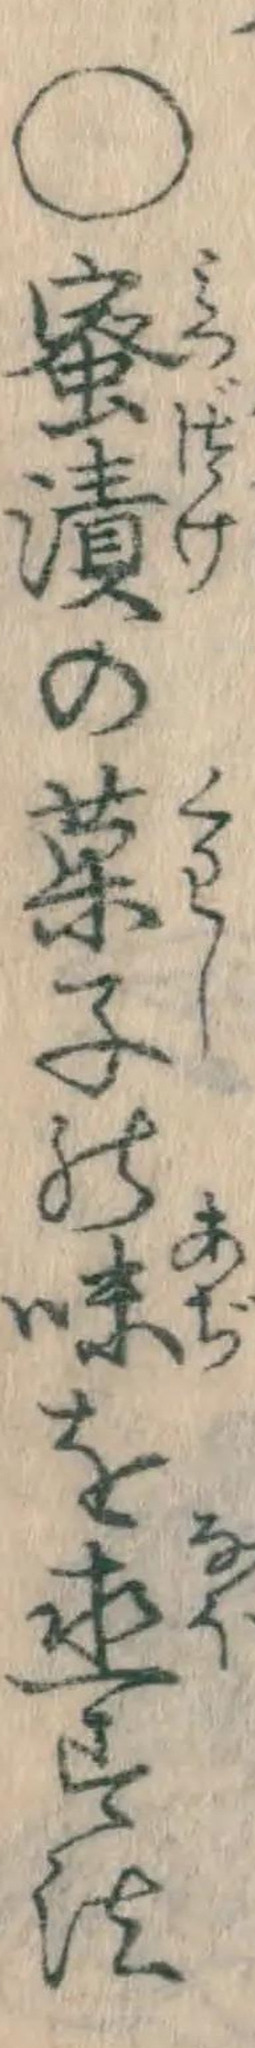○蜜漬の菓子の味を直す法

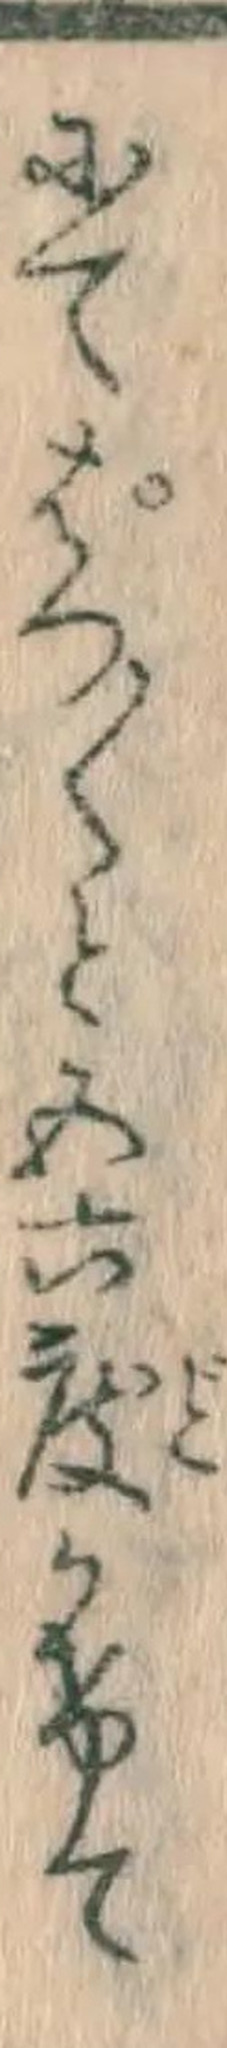にてぱつ〳〵と五六度かけて
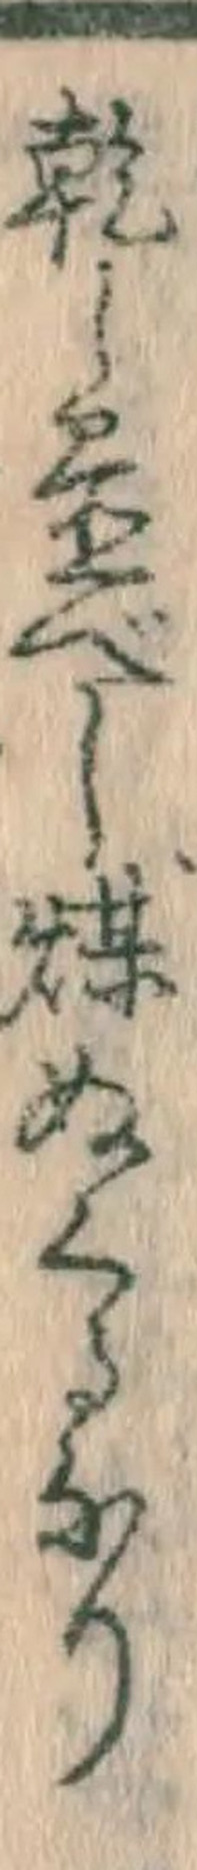乾し置べし煤ぬくるなり
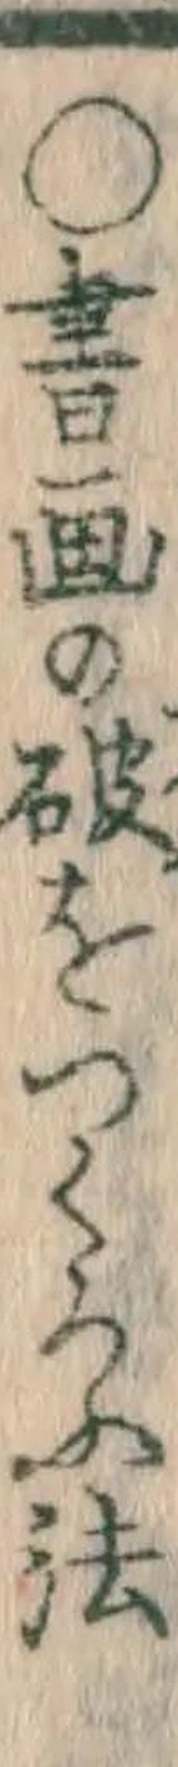○書画の破をつくろふ法
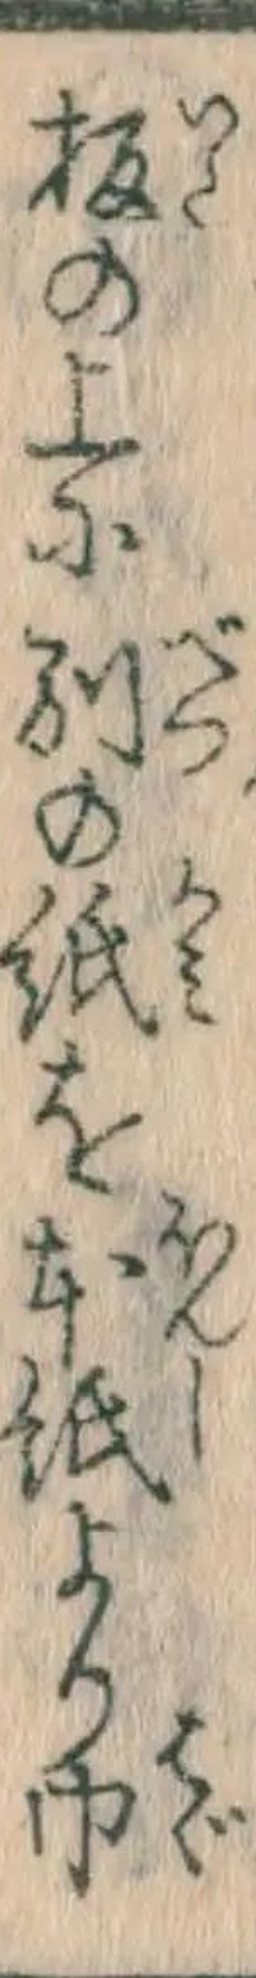板の上に別の紙を本紙より巾
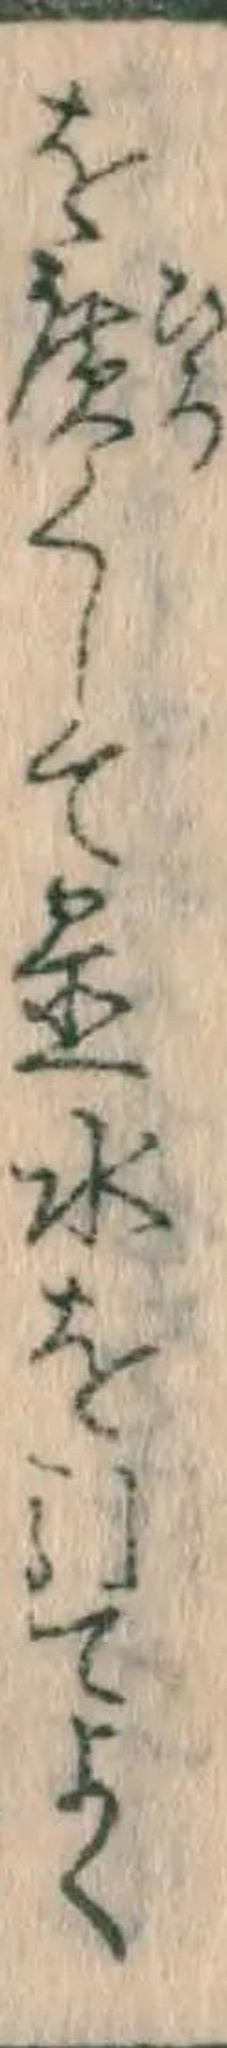を広くして置水を引てよく
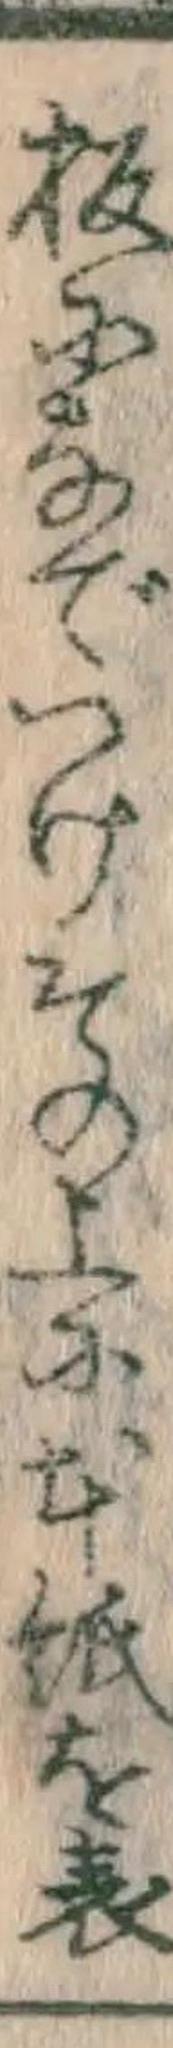板になでつけその上に本紙を表
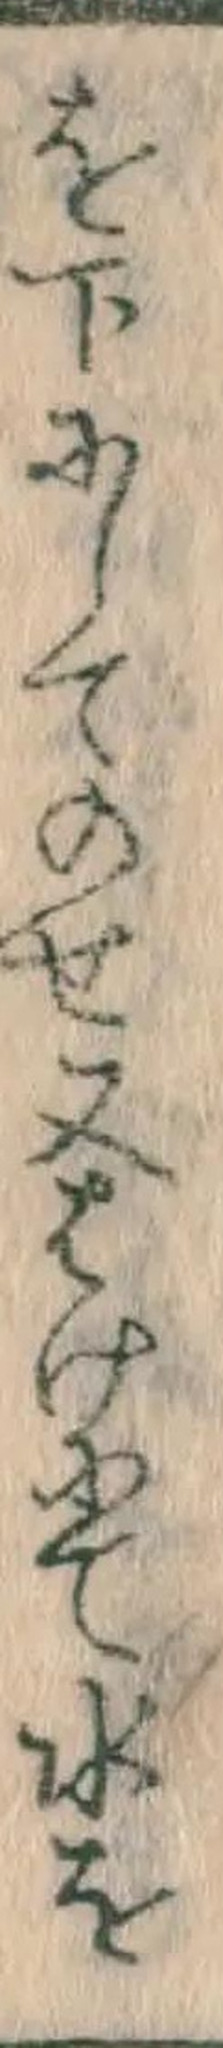を下にしてのせ又はけにて水を
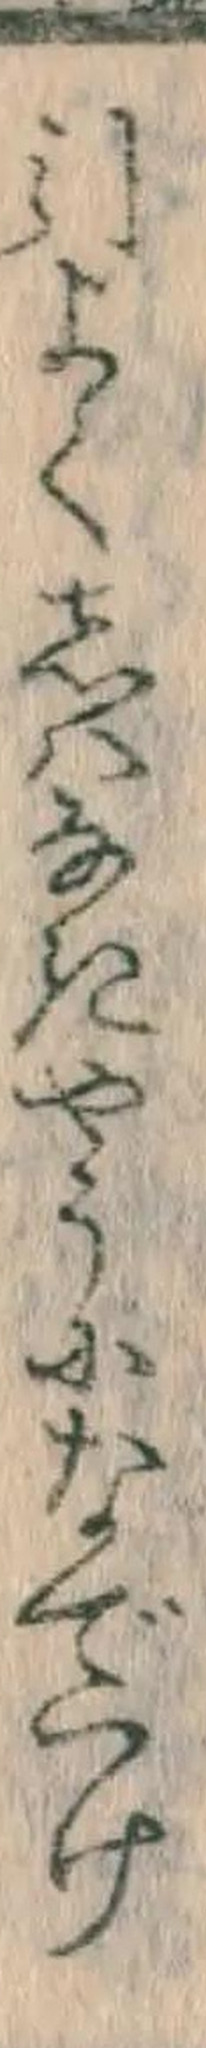引よくしはなきやうになでつけ
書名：広益秘事大全 3巻. [2]
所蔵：国立国会図書館 National Diet Library, JAPAN
